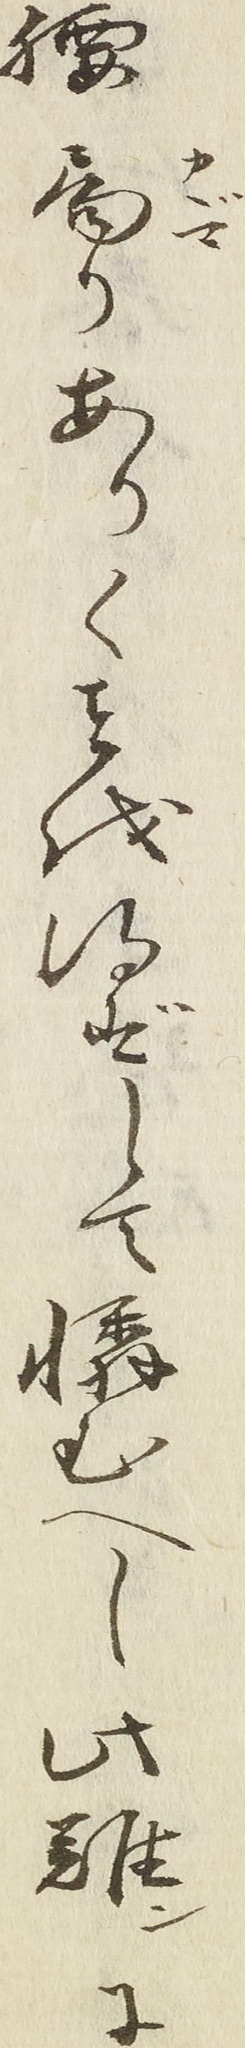腰屈りありくことを得ずして憐むへし此難
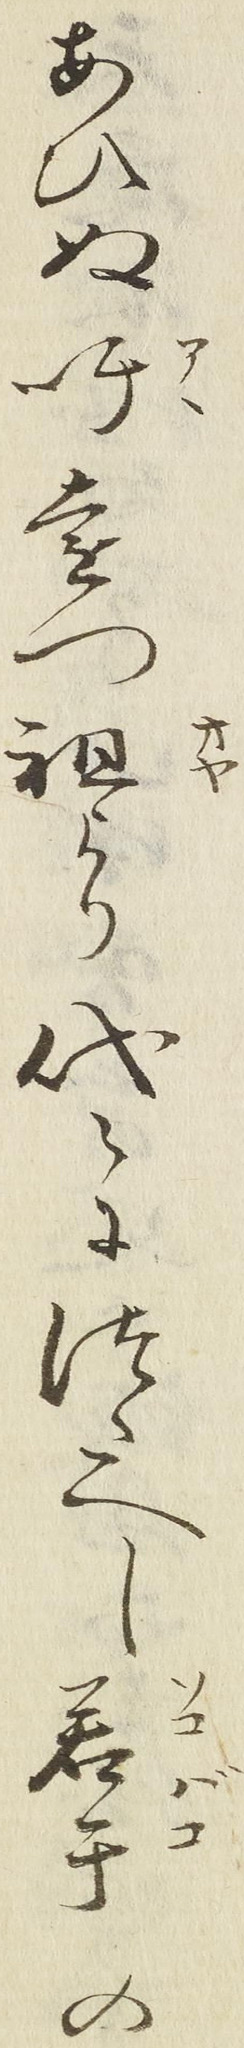あひぬ呼遠つ祖より代〻につたへし若干の
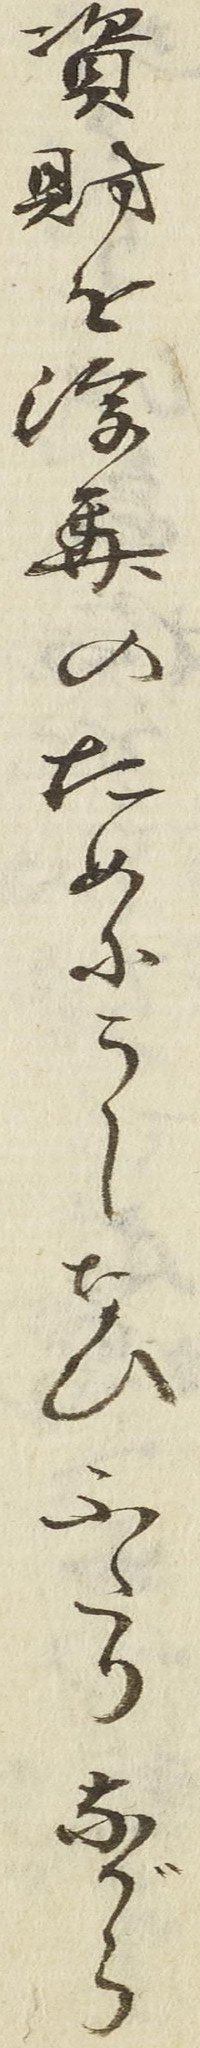資財を浮華のためにうしなひふたりながら
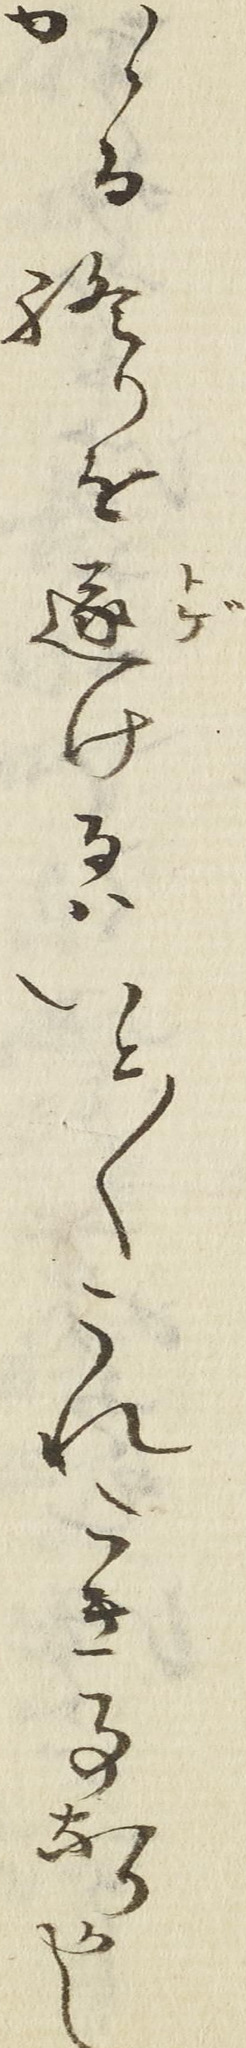かゝる終りを遂けるはいと〳〵うれたき事なりかし
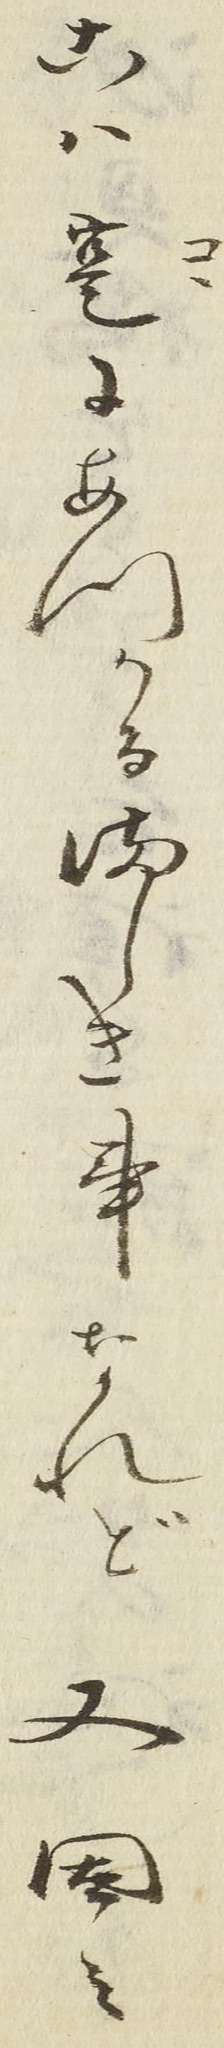こは是にあつかるましき事なれど又因み
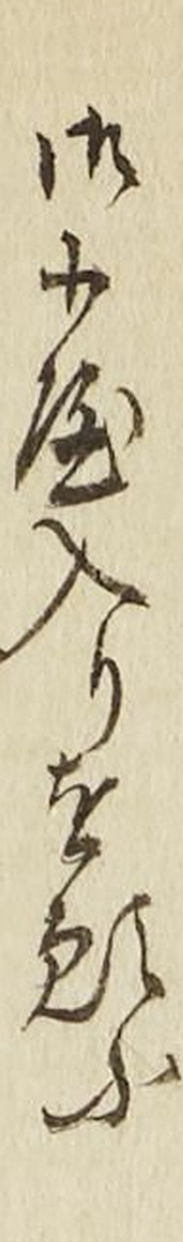御小屋入りを願ふ
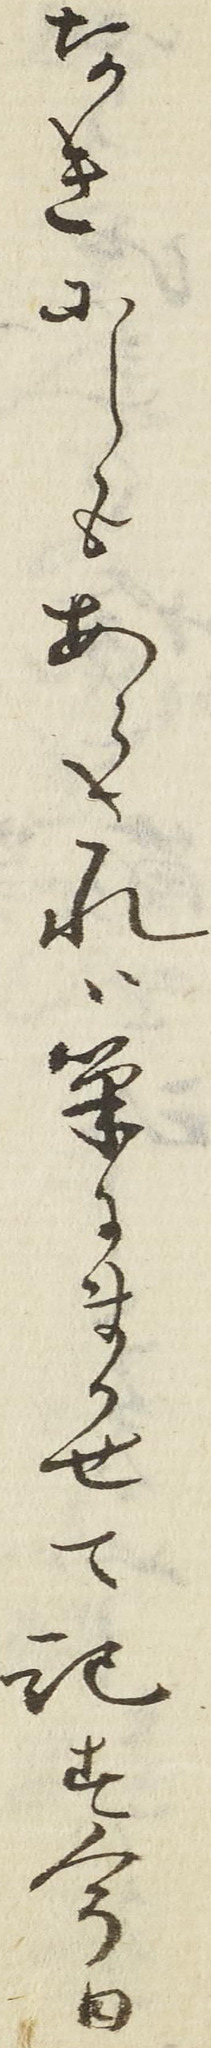なきにしもあらされは筆にまかせて記す今日
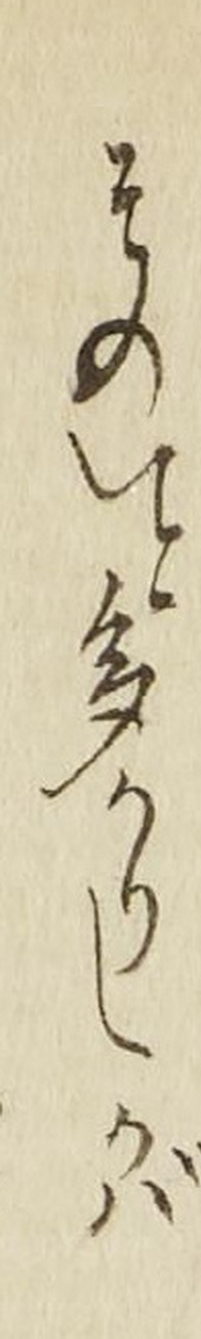そのいと多かりしかば
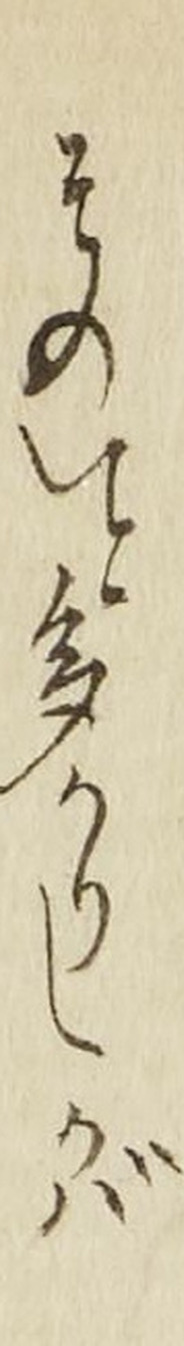そのいと多かりしかば
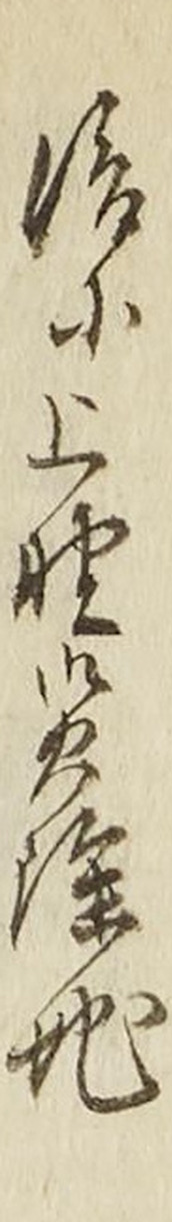後に上野御火除地
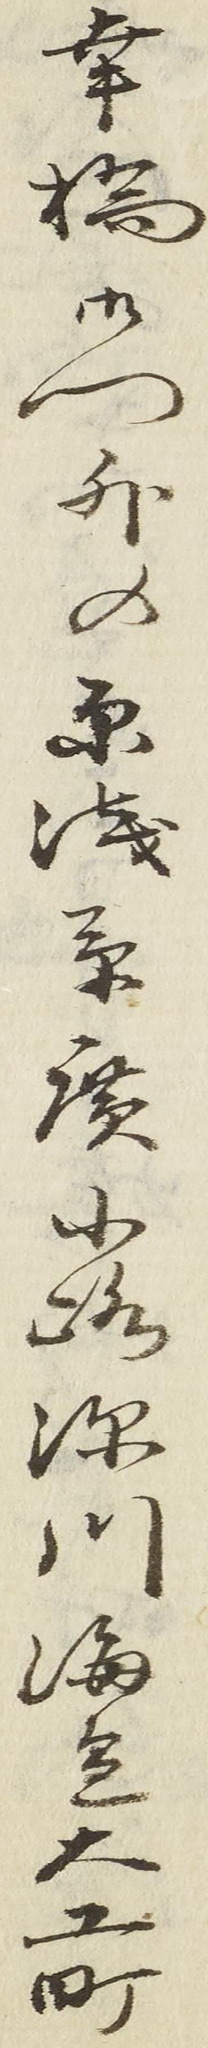幸橋御門外の原浅草広小路深川海辺大工町
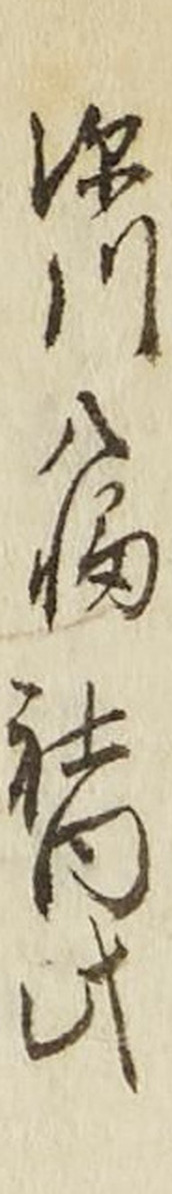深川八幡社内此
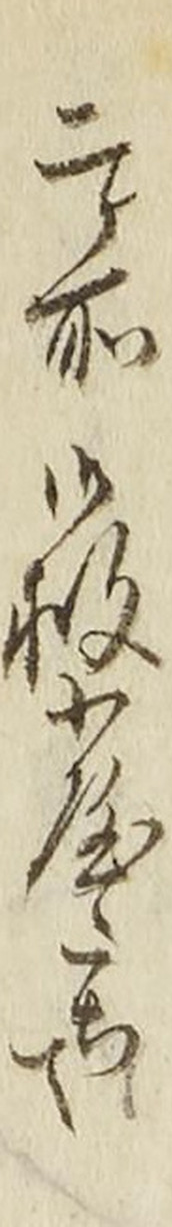二ケ所御救小屋たちて
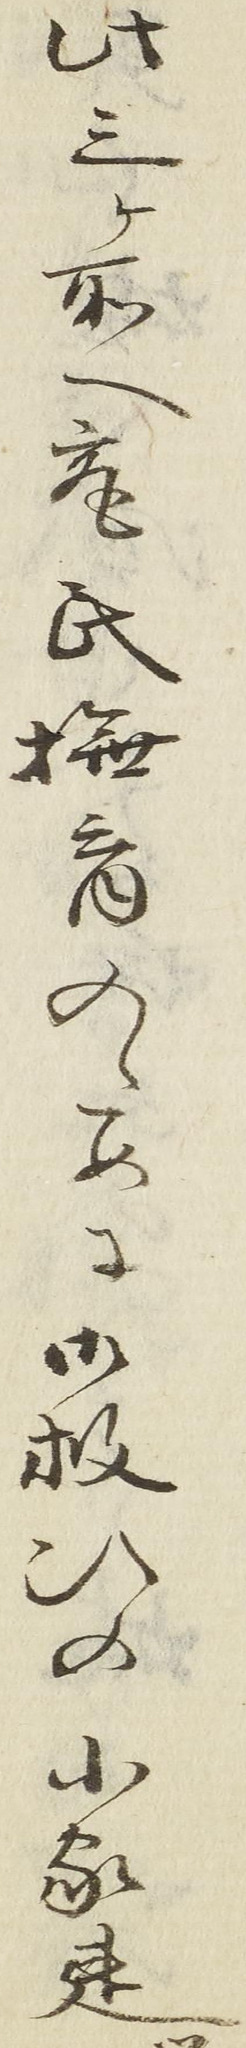此三ケ所へ究民撫育のために御救ひの小家建
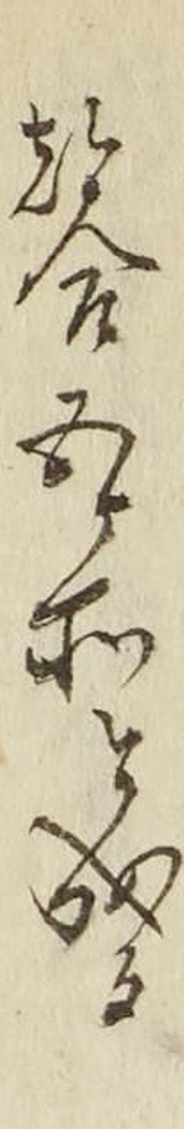都合五ケ所と成る
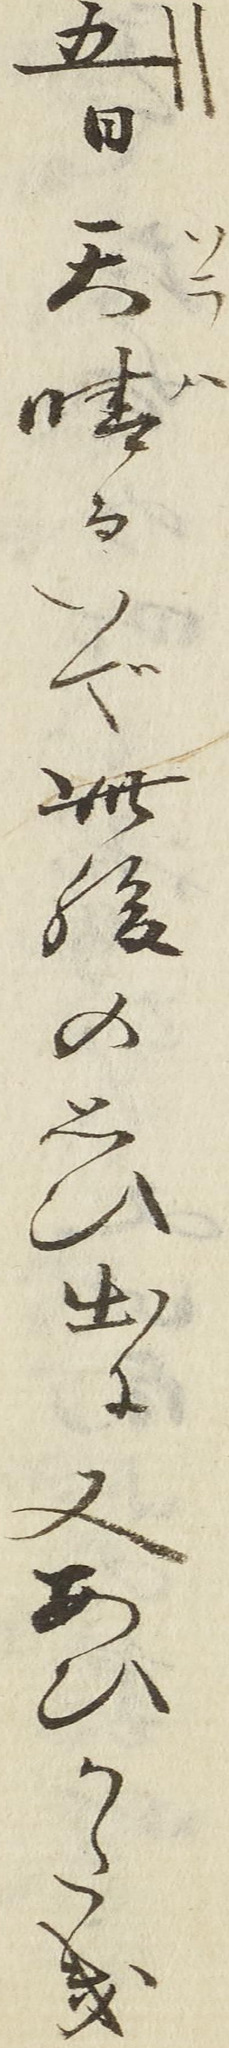五日天晴るいで此後の思ひ出に又あひかたき
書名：やぶれ窓の記　全
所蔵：東京大学地震研究所図書室 Earthquake Research Institute Library, The University of Tokyo, JAPAN
